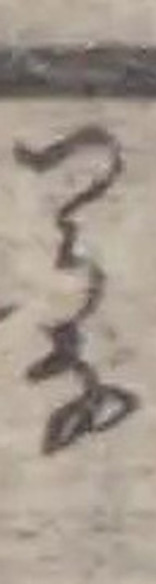つうな
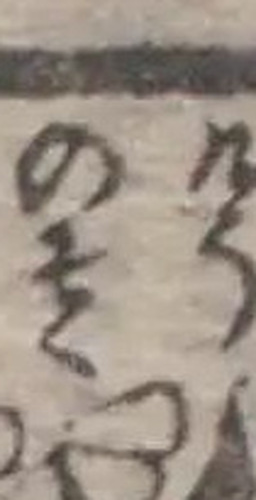のそく
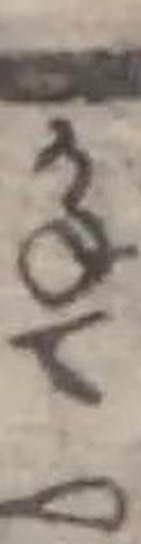かねて
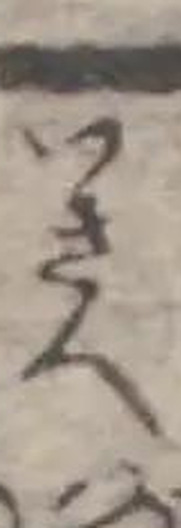いき人
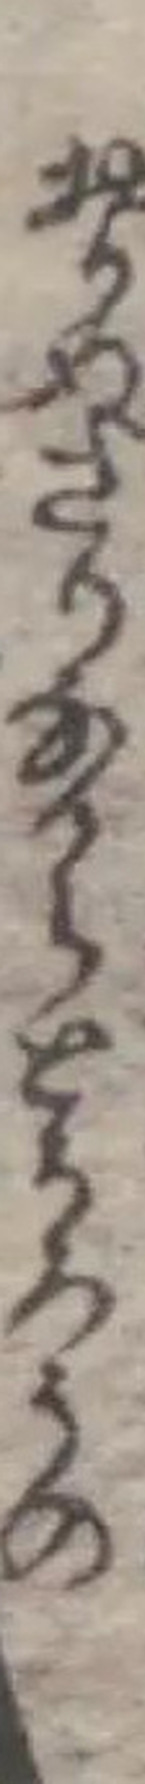おかぬさりなからとうろうの
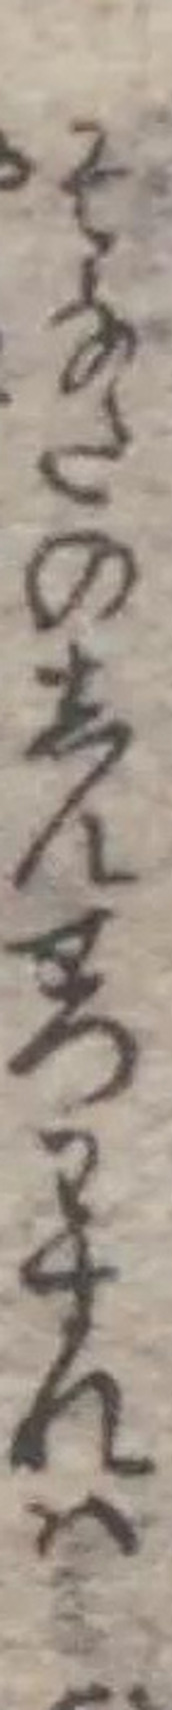そなたのしんせつわすれは
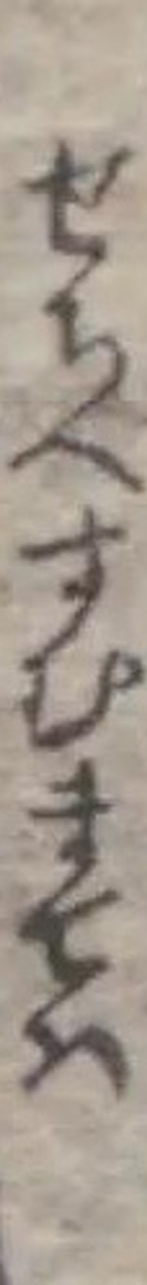せちへすむまては
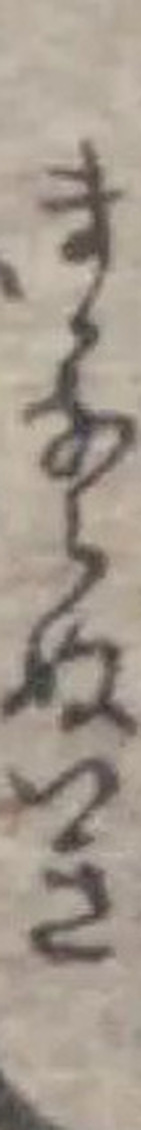まゝならぬいき
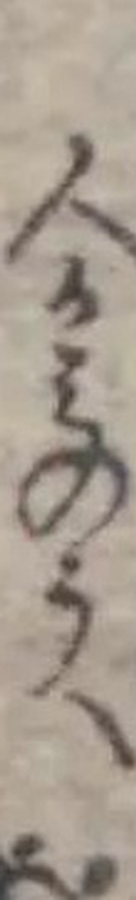人かみのうえ
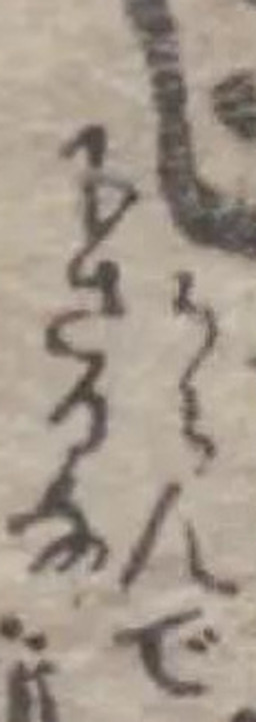下さるな
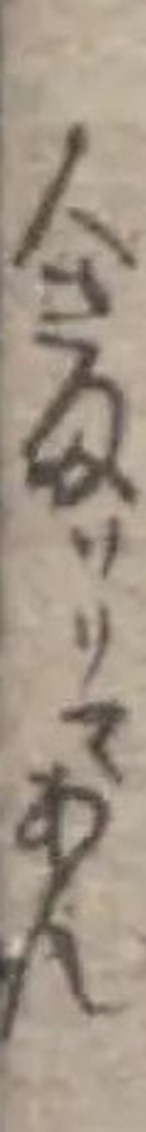人さまサリてあん
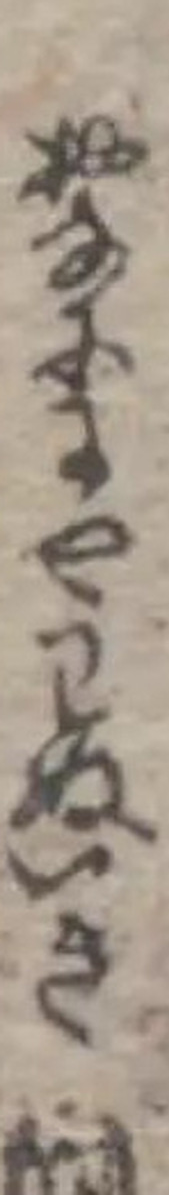おなににやわぬいき
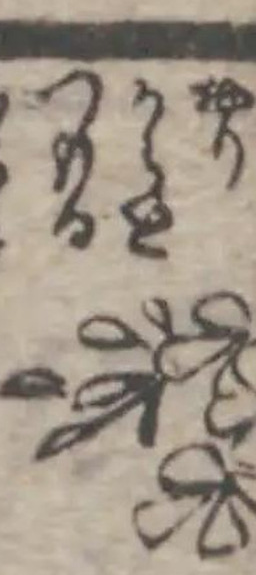つもる
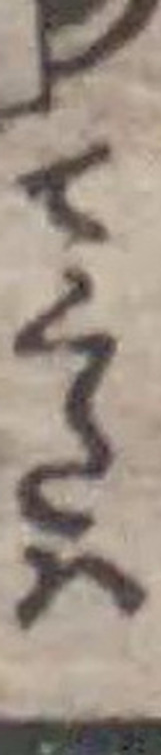てくたは
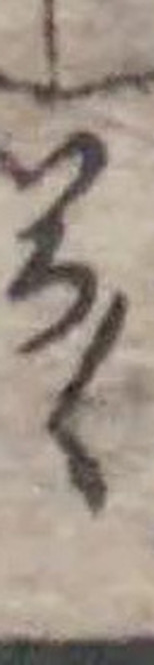いろ〳〵
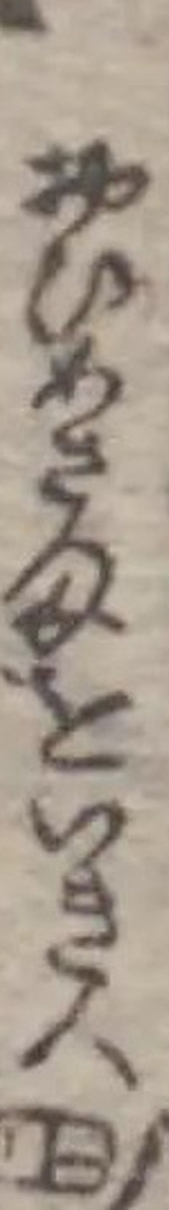おひめさまをいき人
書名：富多高慢噺 3巻
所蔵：国立国会図書館 National Diet Library, JAPAN
